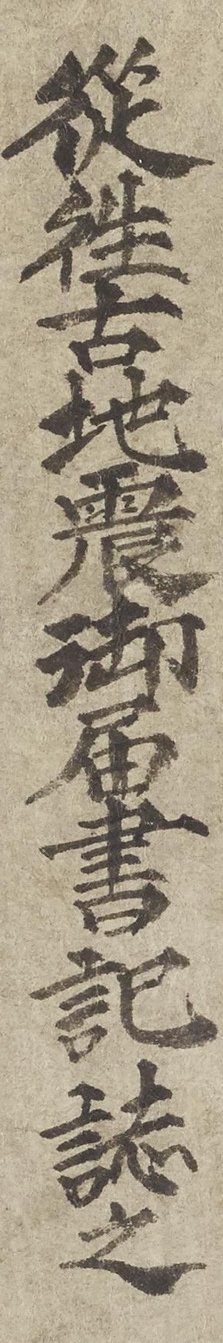従往古地震御届書記誌之一

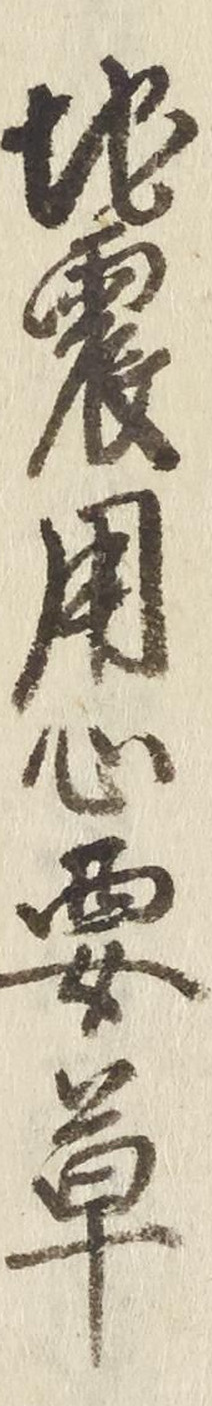地震用心要草
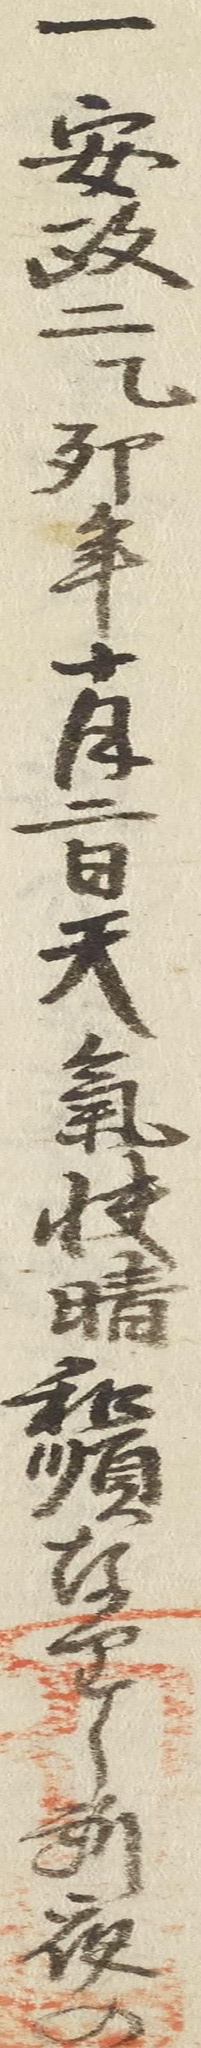一安政二乙卯年十月二日天気快晴和順なりし所夜の
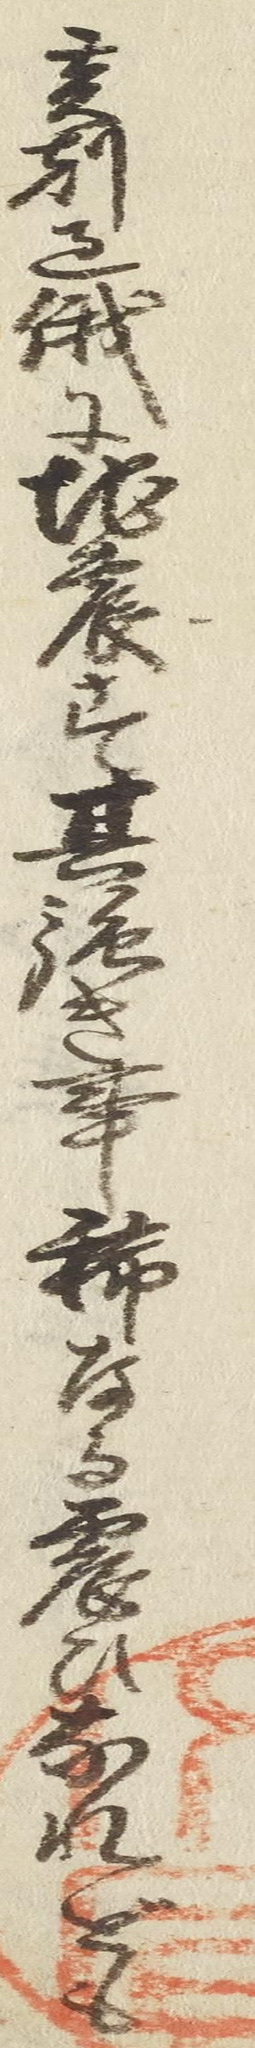亥刻過俄に地震す其強き事稀なる震ひなれども
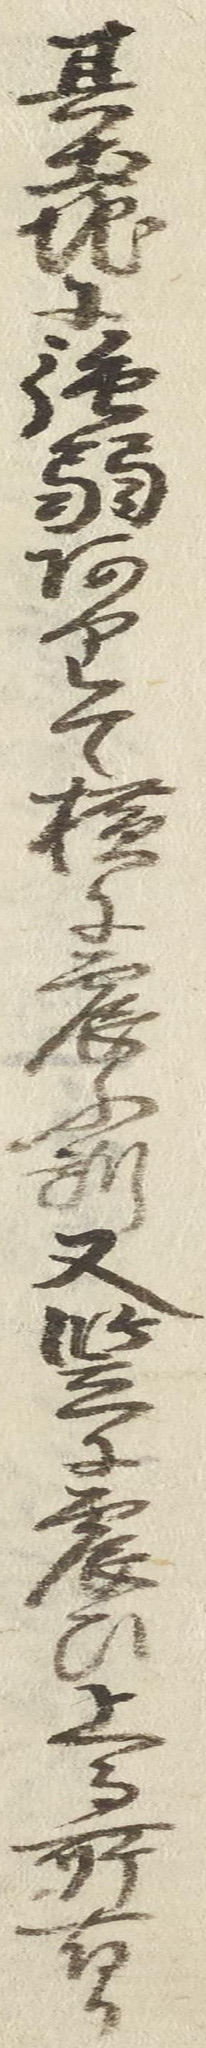其土地に強弱ありて横に震ふ所また竪に震ひ上る所有り
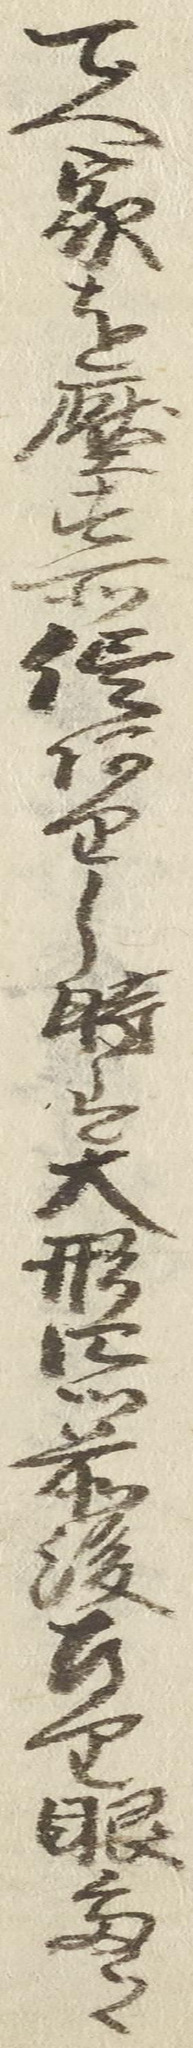て人家を壓す所儘ありし時は大形四ッ前後なり眼たゝく
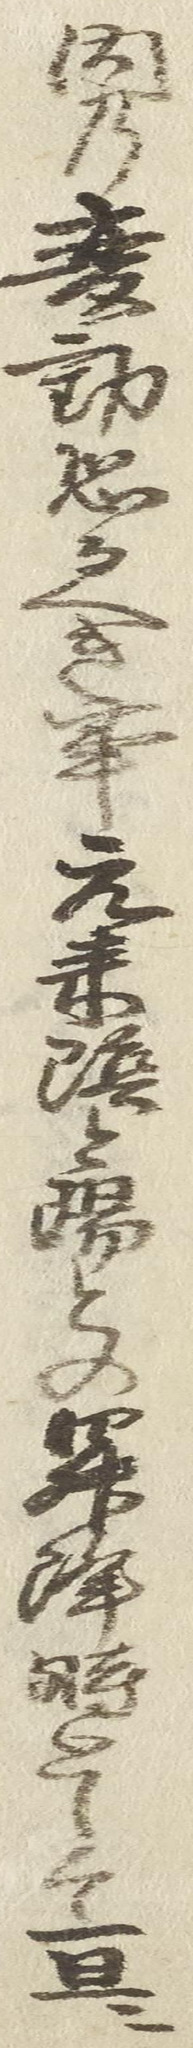内の変動恐るへき事元来陰と陽との昇降時として一旦二
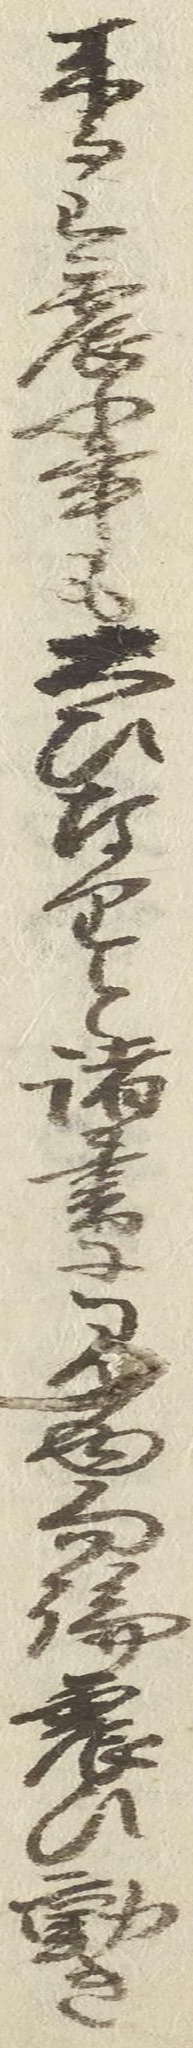来るは震ふ事も大ひなりと諸書に見ゆ勿論震ひ動き
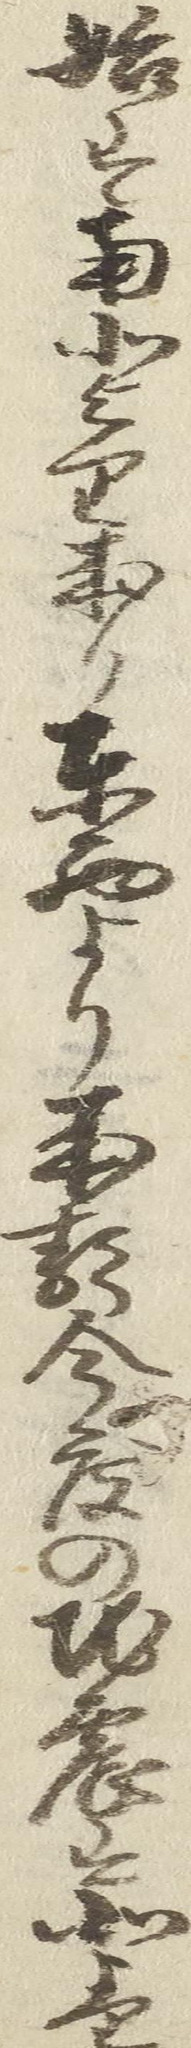始は南北より来り東西より来る今度の地震は北より
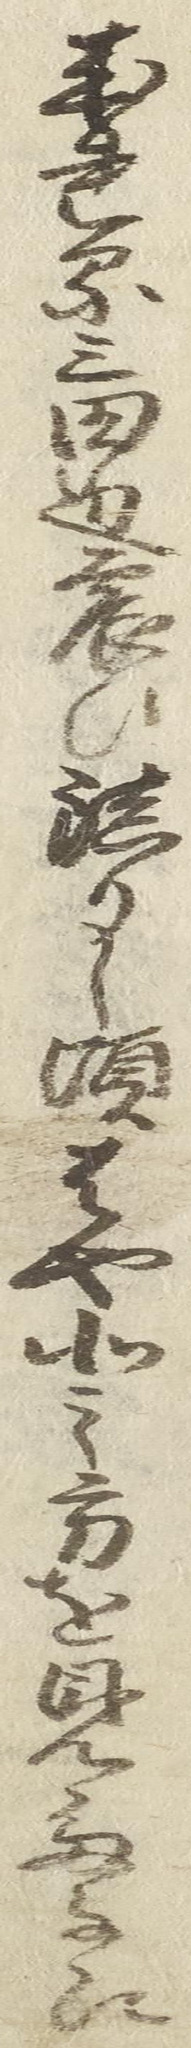来れる三田辺震ひ鎮りし頃はや北之方を見たるに
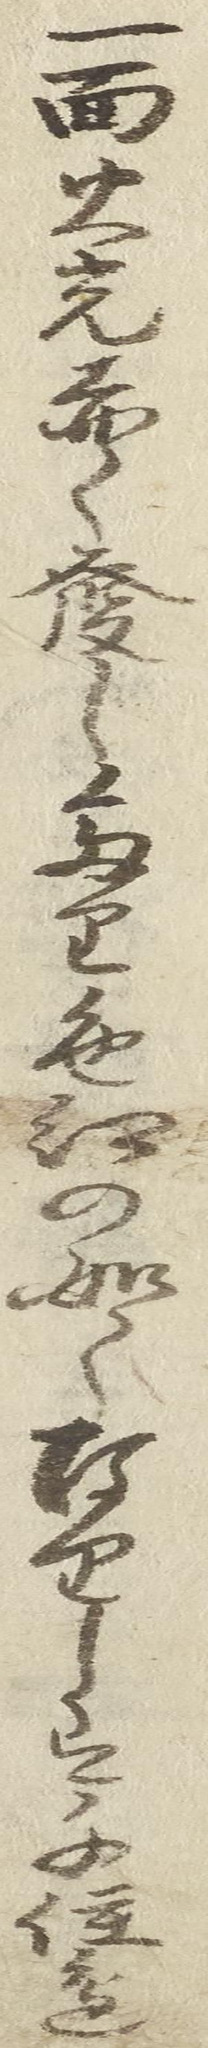一面火光赤く発したたり色紅の如くなりしは千住辺

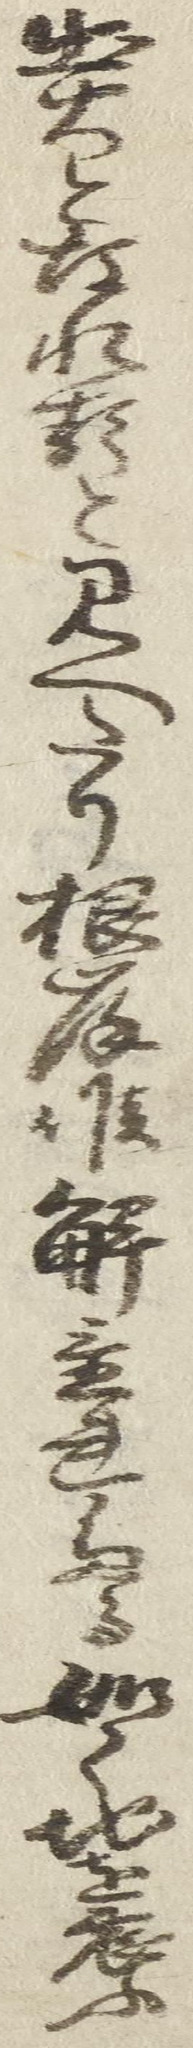出火となれると見へたり根岸侯解置れたる如く地を震ふ
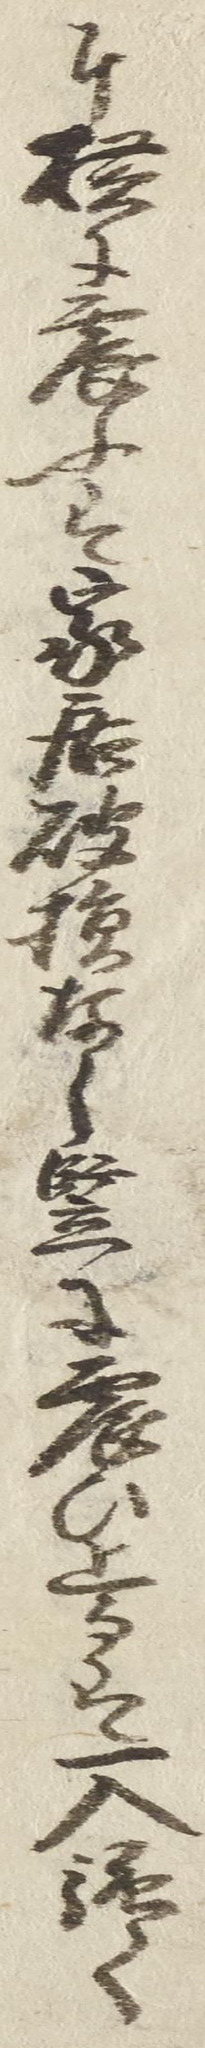に横に震ふは家居破損なく竪に震ひ上るは一入強く
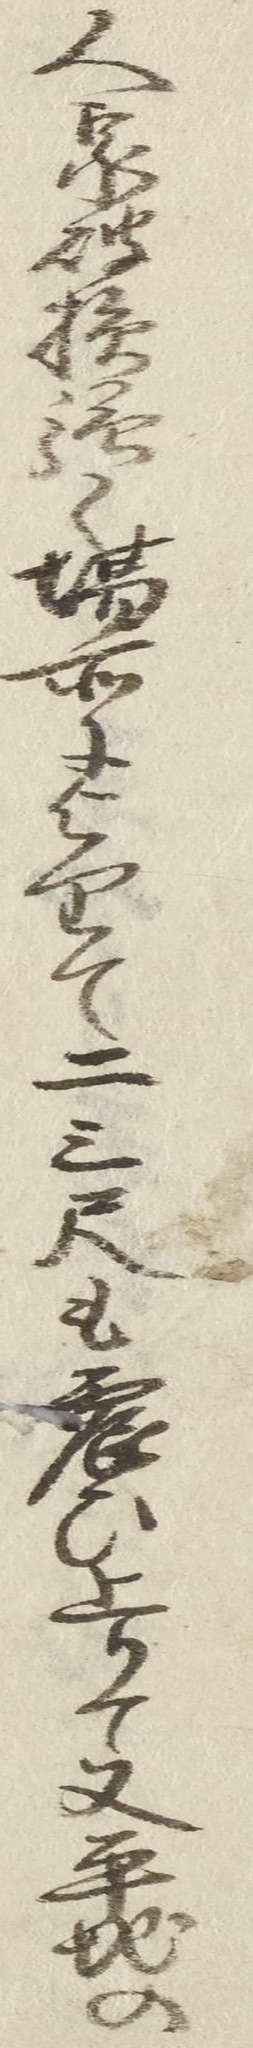人家破損強く場所によりて二三尺も震ひ上りて又平地の
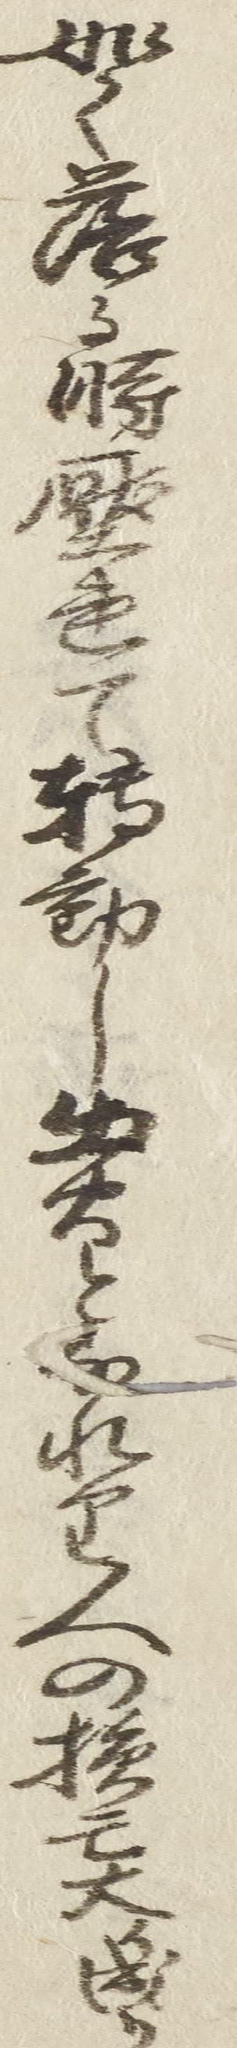如く落る時壓れて転動し出火となれり人の損亡大く成り
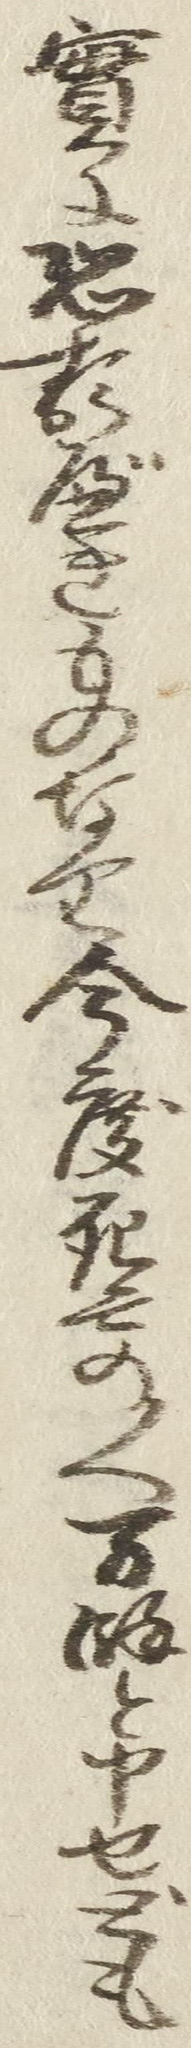実に恐るべきものなり今度死亡の人万餘と申せども
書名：従往古地震御届書記誌之一
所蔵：東京大学地震研究所図書室 Earthquake Research Institute Library, The University of Tokyo, JAPAN
